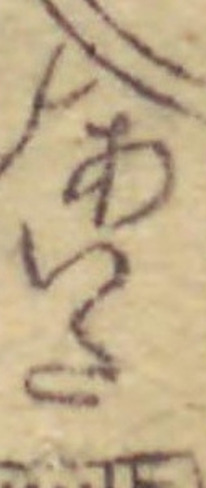あいた
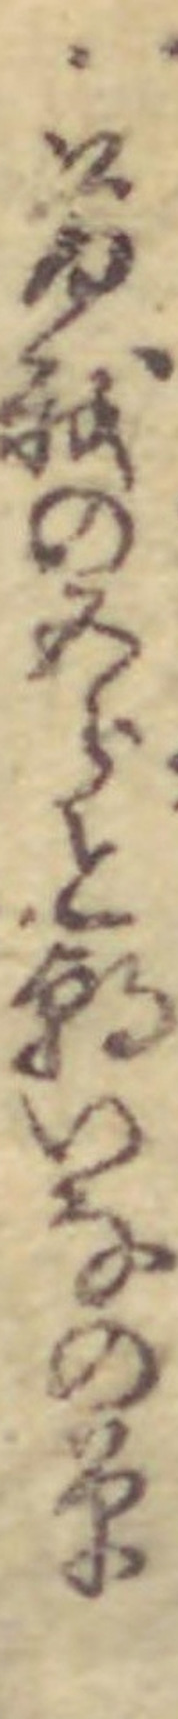曽我の五郎と朝いなの草
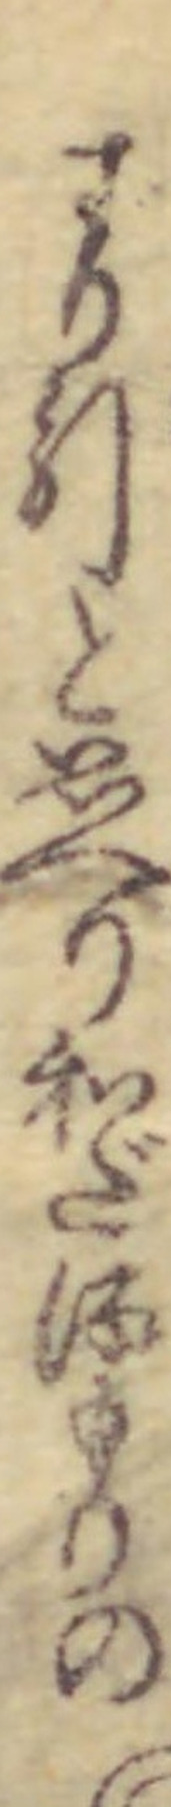すり引と思へり和田坂もりの
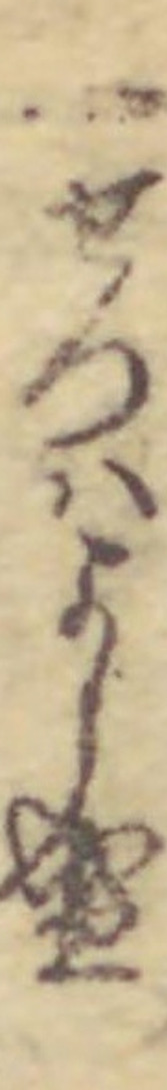せつはよし盛
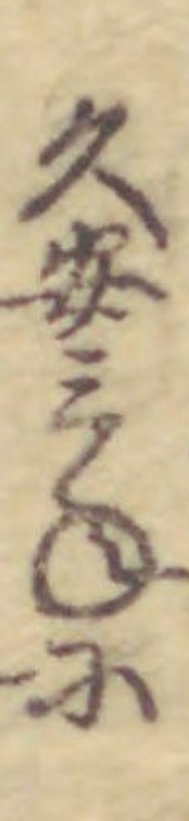久安三年に
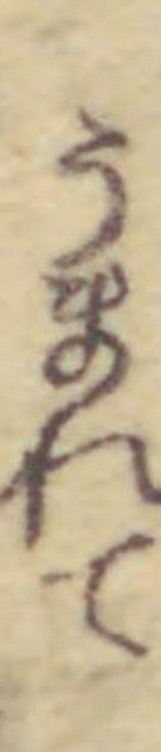うまれて
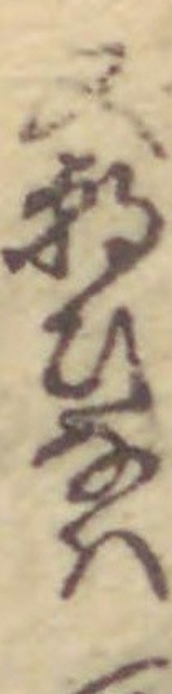又朝ひなは
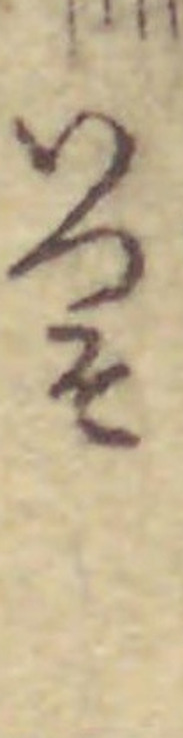いつそ
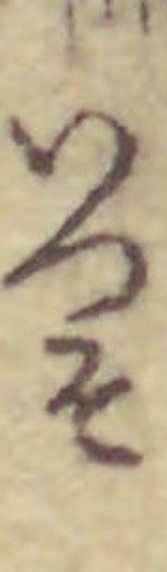いつそ
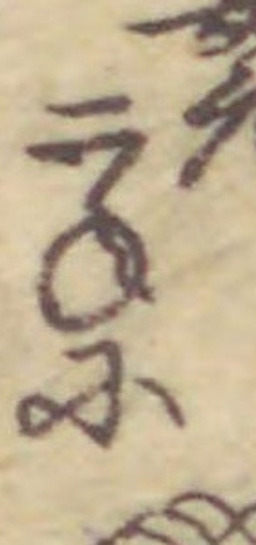二年に
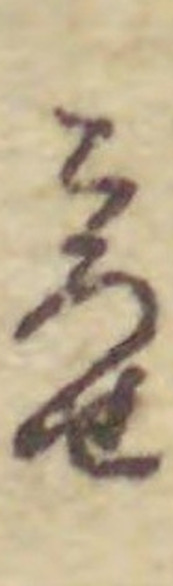ころせ
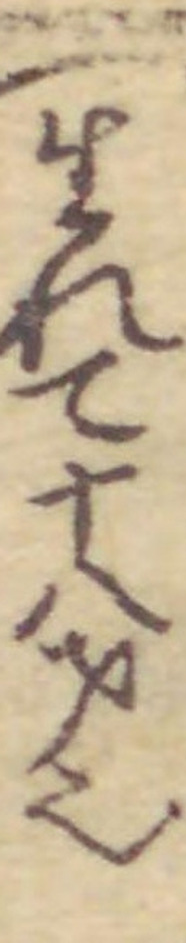生れて十八才也
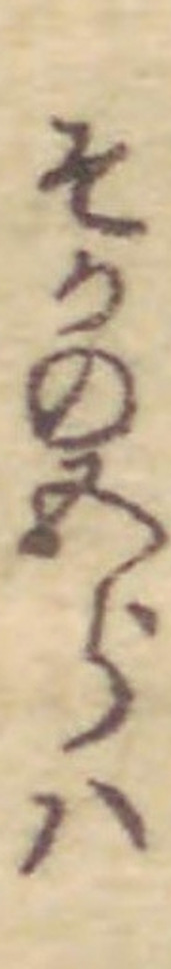そかの五郎は
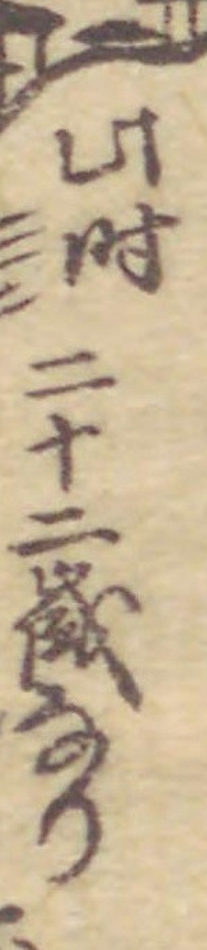此時二十二歳なり

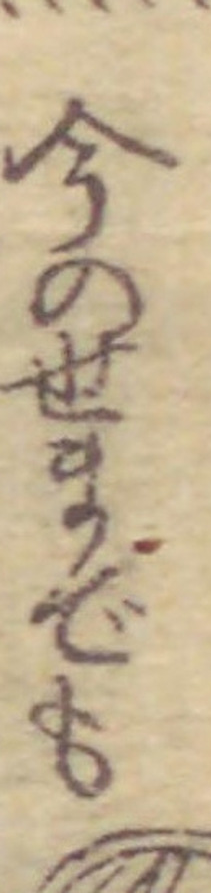今の世までも
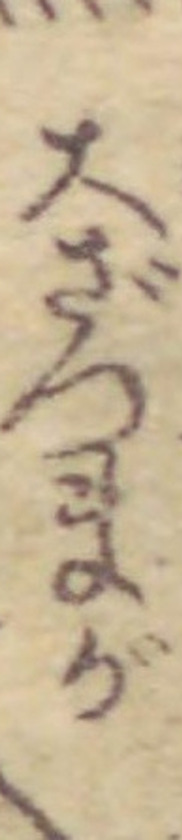大ざつまが
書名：朝比奈草摺実記 2巻
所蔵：国立国会図書館 National Diet Library, JAPAN
